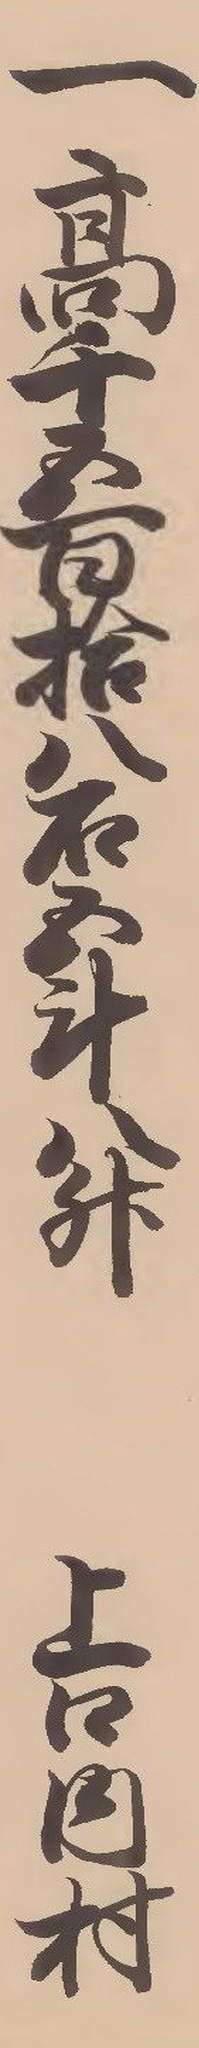一高千五百拾八石五斗八升上口内村
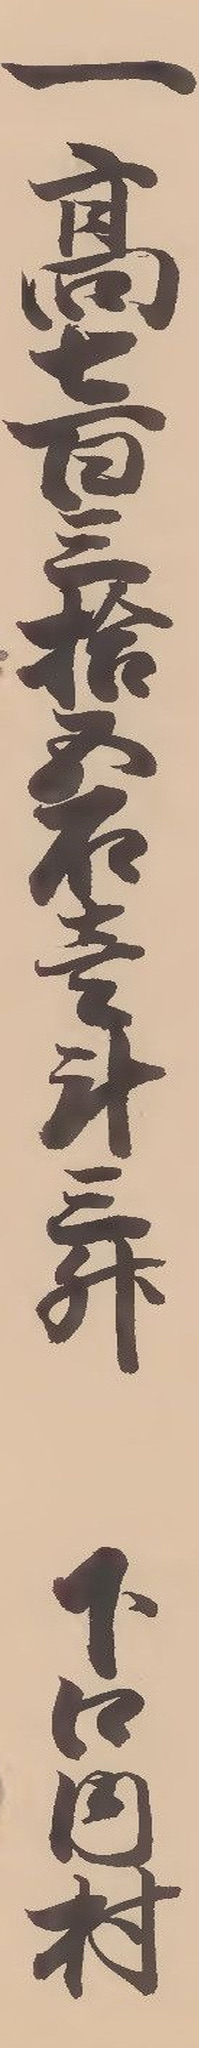一高七百三拾五石壱斗三升下口内村

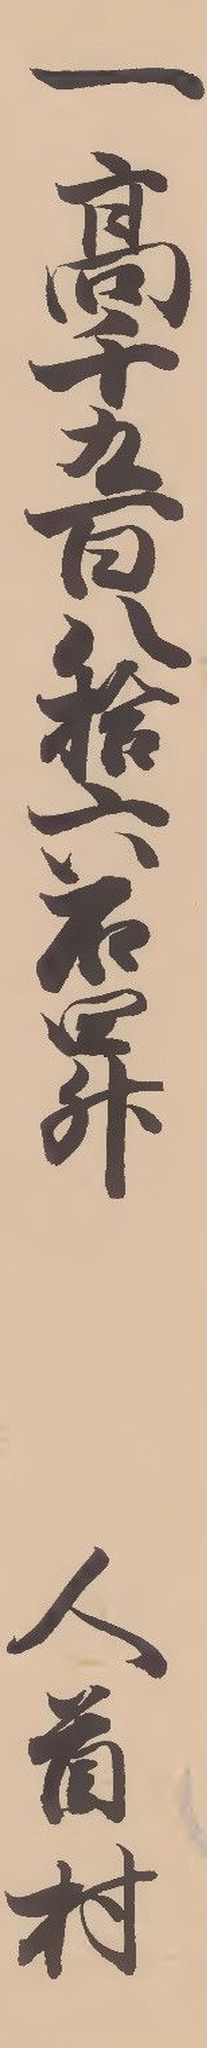一高千九百八拾六石四升人首村
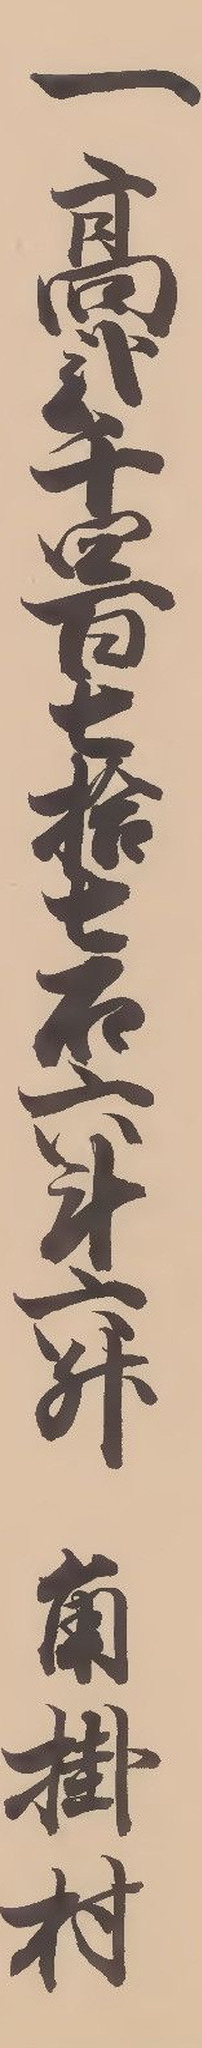一高弐千四百七拾七石六斗六升角掛村
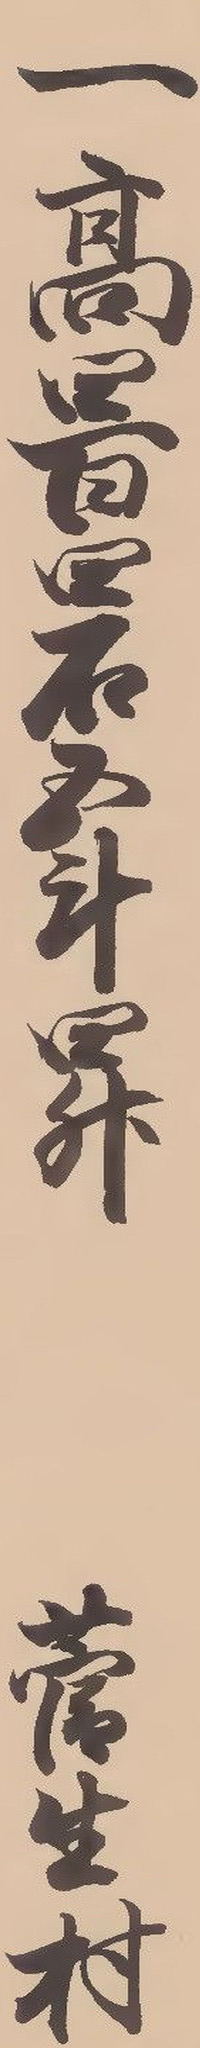一高四百四石五斗四升菅生村
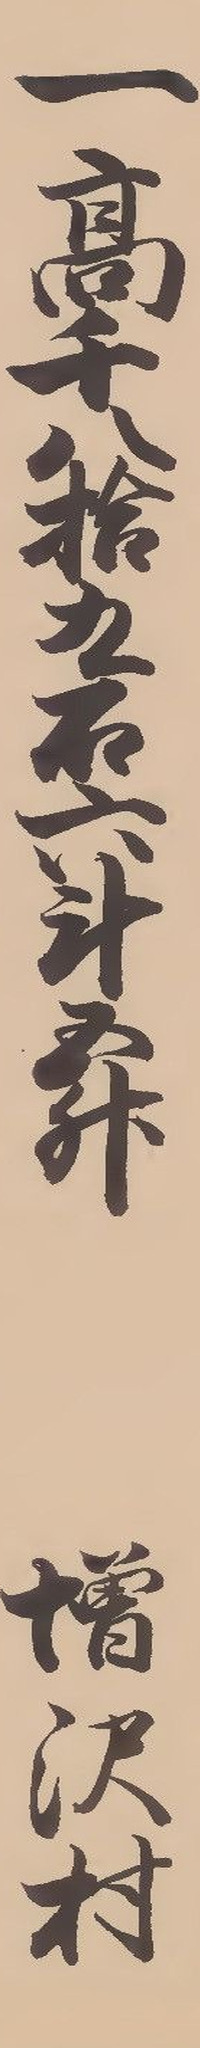一高千八拾九石六斗五升増沢村
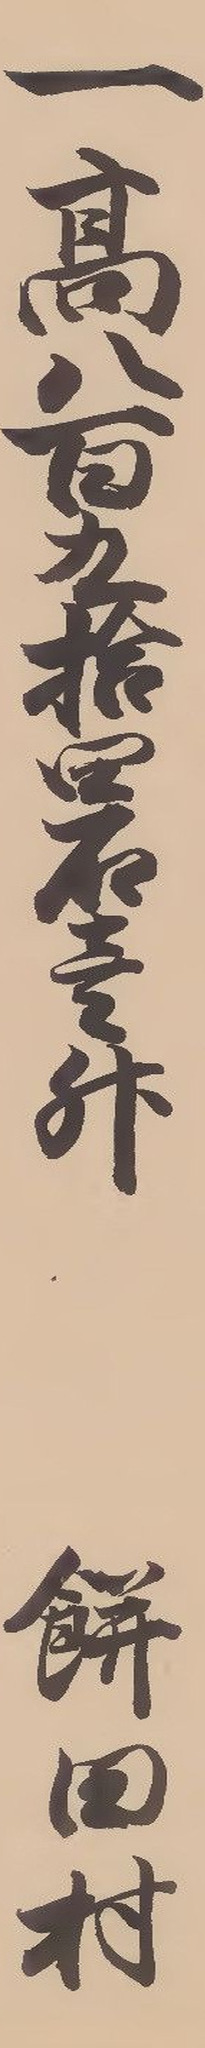一高八百九拾四石壱升餅田村
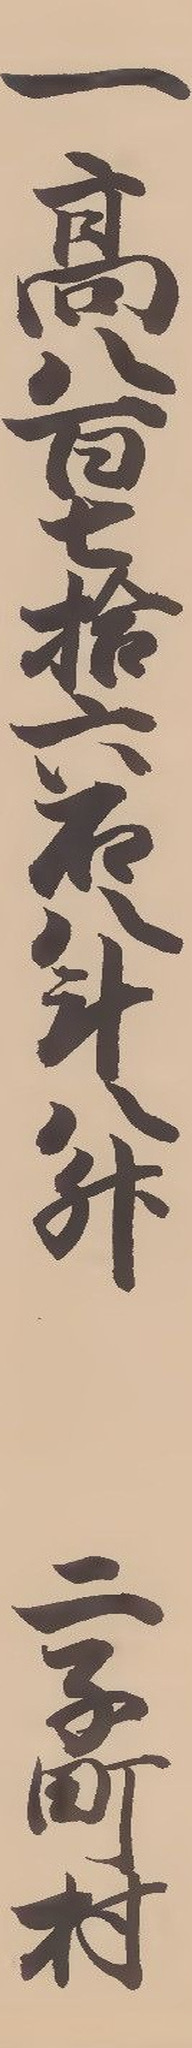一高八百七拾六石八斗八升二子町村
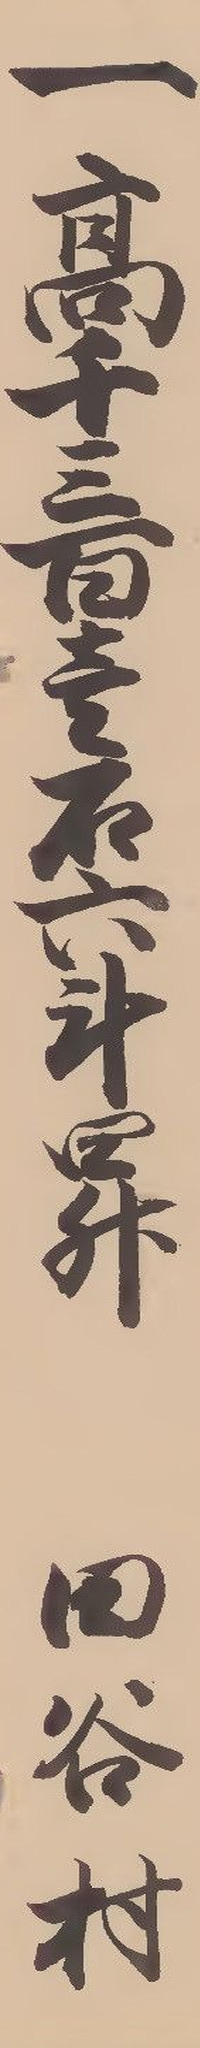一高千三百壱石六斗四升田谷村

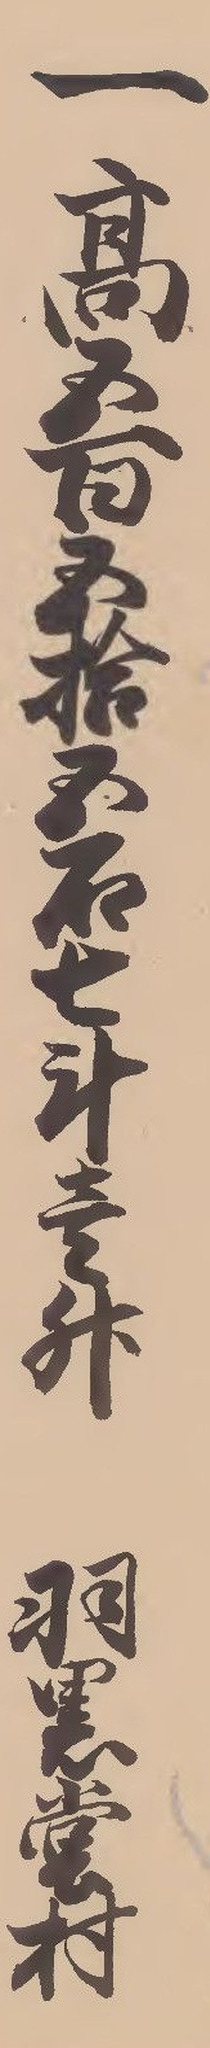一高五百五拾五石七斗壱升羽黒堂村
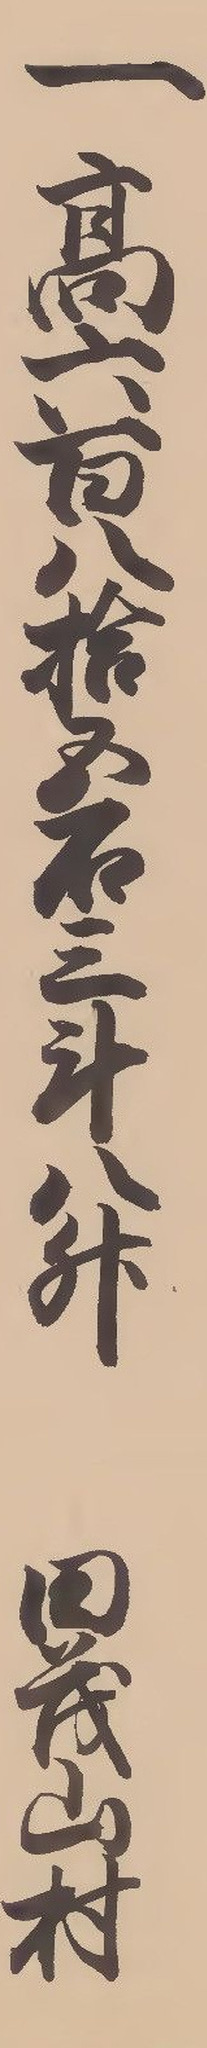一高六百八拾五石三斗八升田茂山村
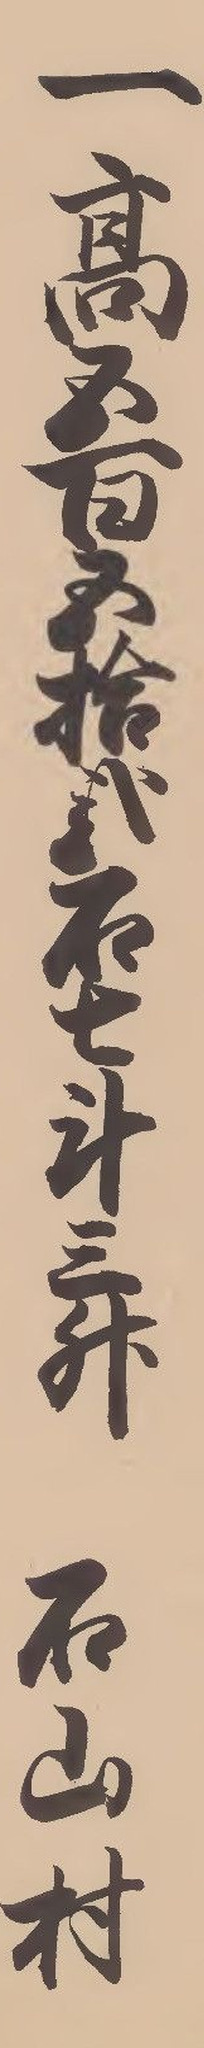一高五百五拾弐石七斗三升石山村
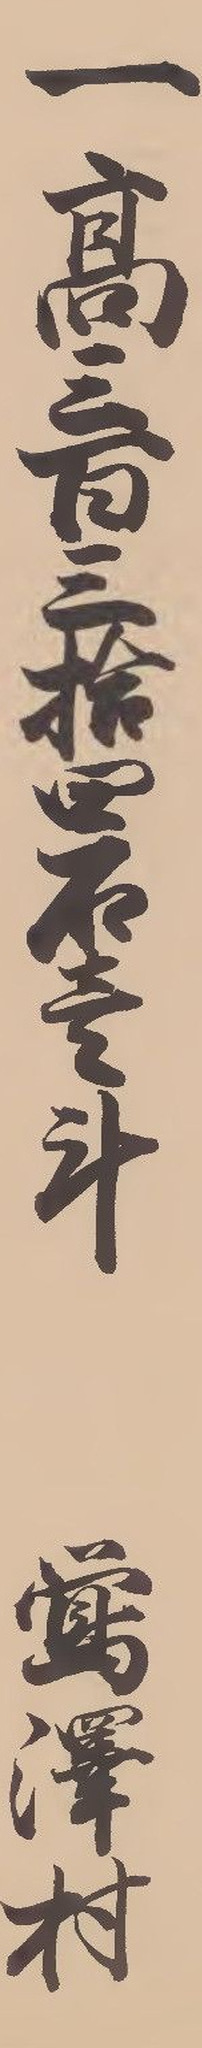一高三百三拾四石壱斗鴬沢村
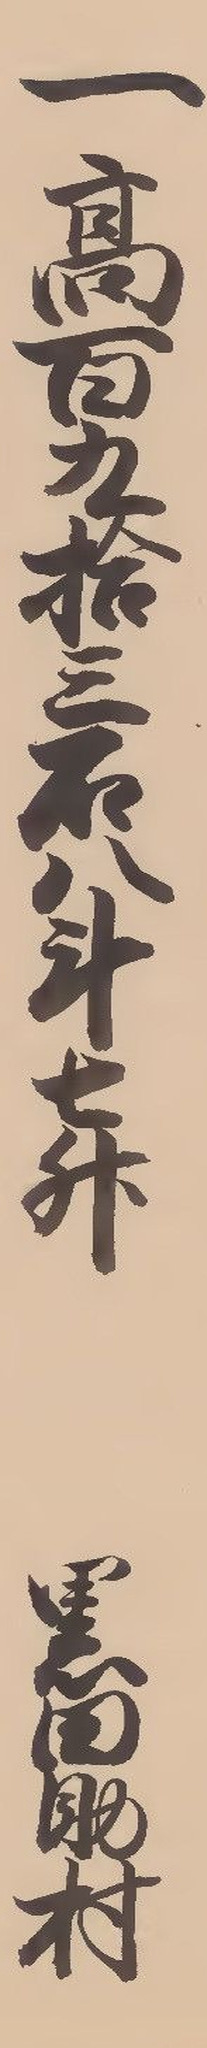一高百九拾三石八斗七升黒田助村
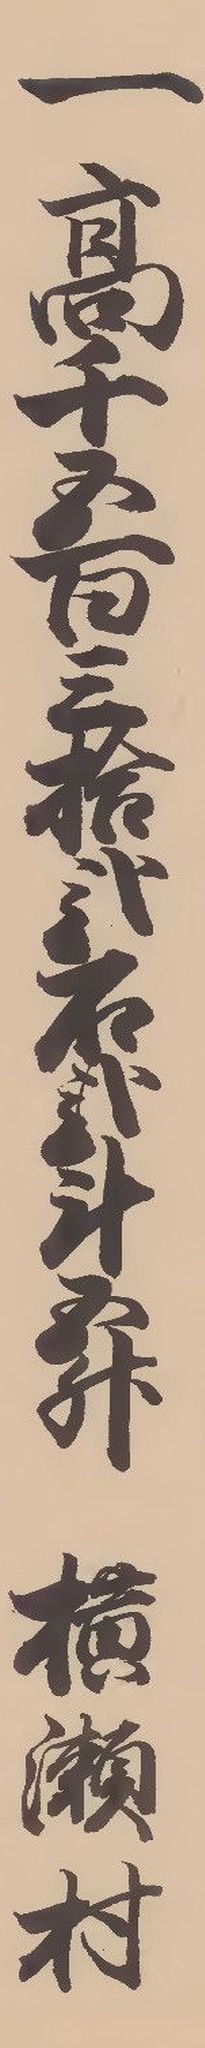一高千五百三拾弐石弐斗五升横瀬村
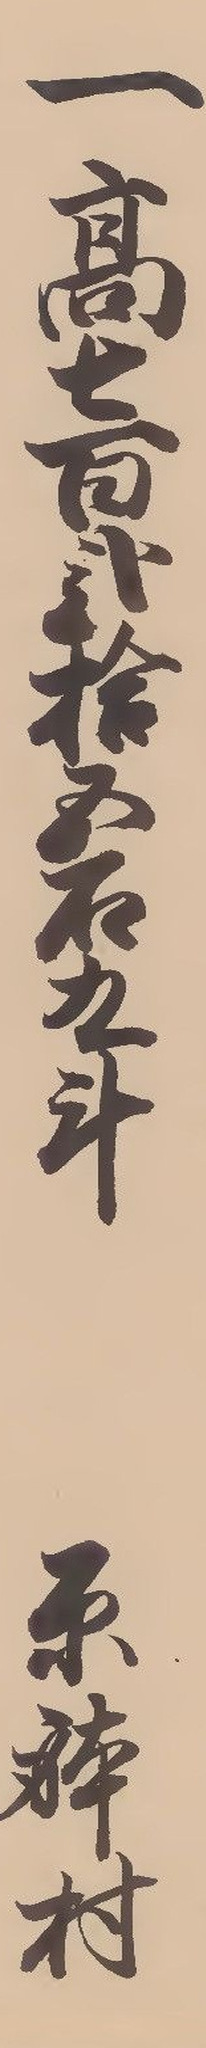一高七百弐拾五石九斗原躰村
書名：陸奥国郷帳　５
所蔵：国立公文書館 National Archives of Japan
